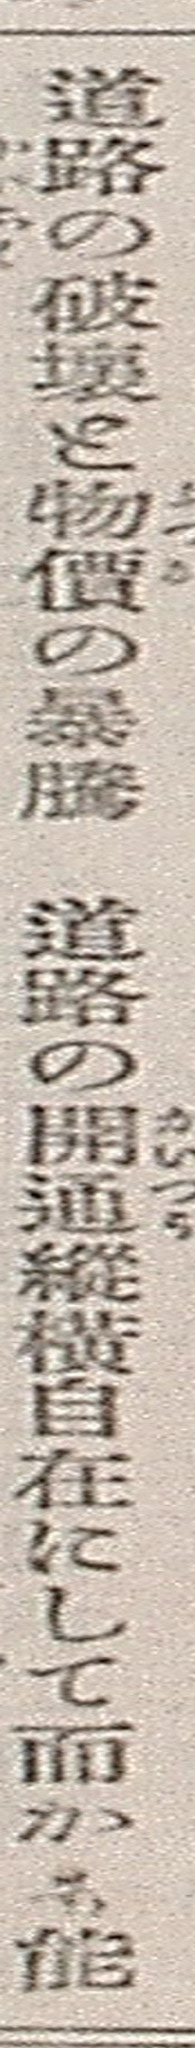道路の破壊と物価の暴騰道路の開通縦横自在にして而かも能
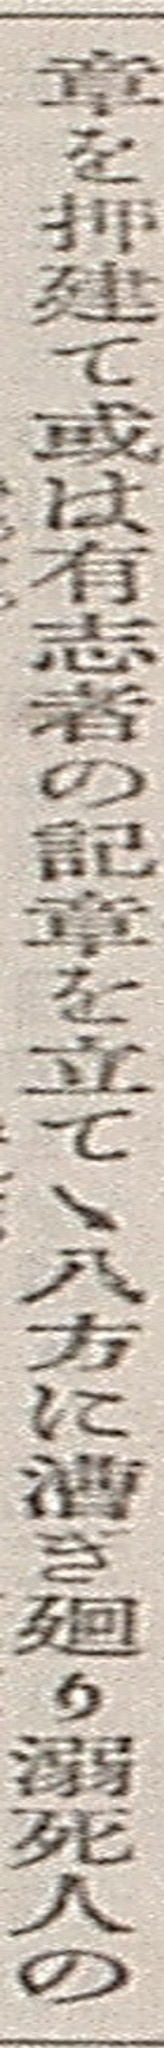章を押建て或は有志者の記章を立てゝ八方に漕ぎ廻り溺死人の
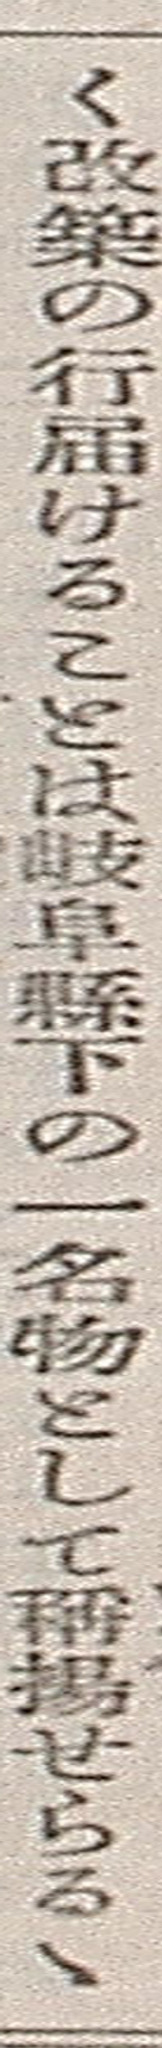く改築の行届けることは岐阜県下の一名物として称揚せらるゝ
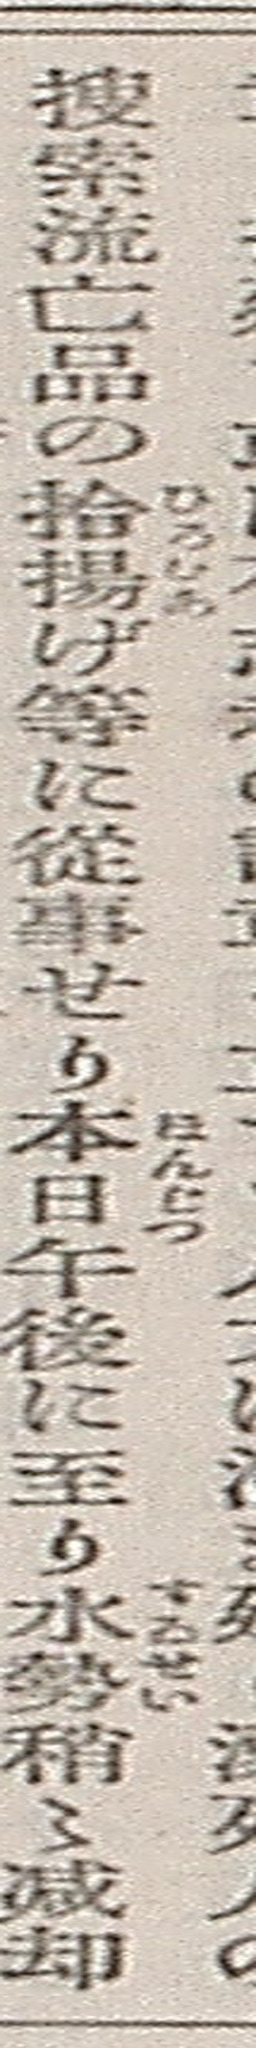捜索流亡品の拾揚げ等に従事せり本日午後に至り水勢稍々滅却
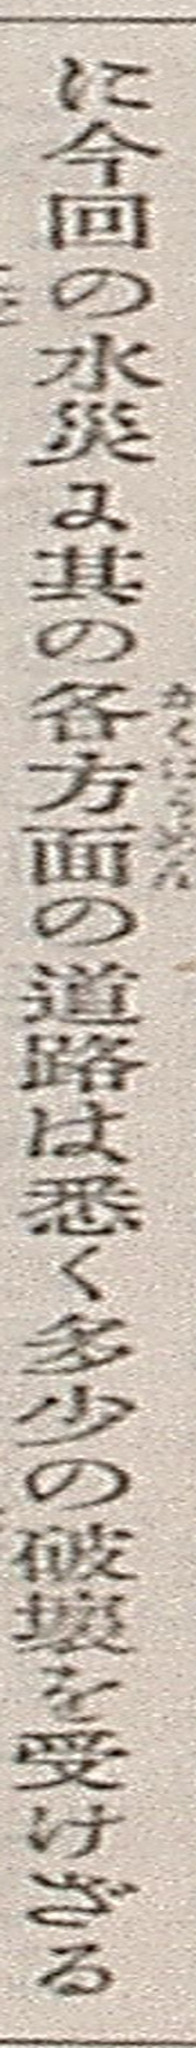に今回の水災に其の各方面の道路は悉く多少の破壊を受けざる
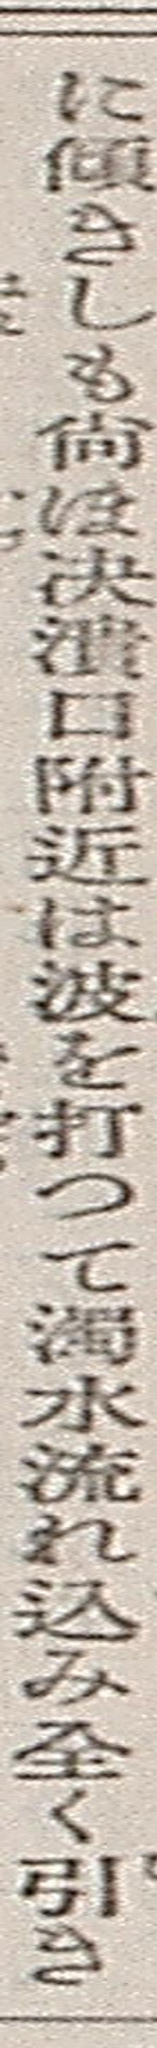に傾きしも尚ほ决潰れ口附近は波を打って濁水流れ込み全く引き
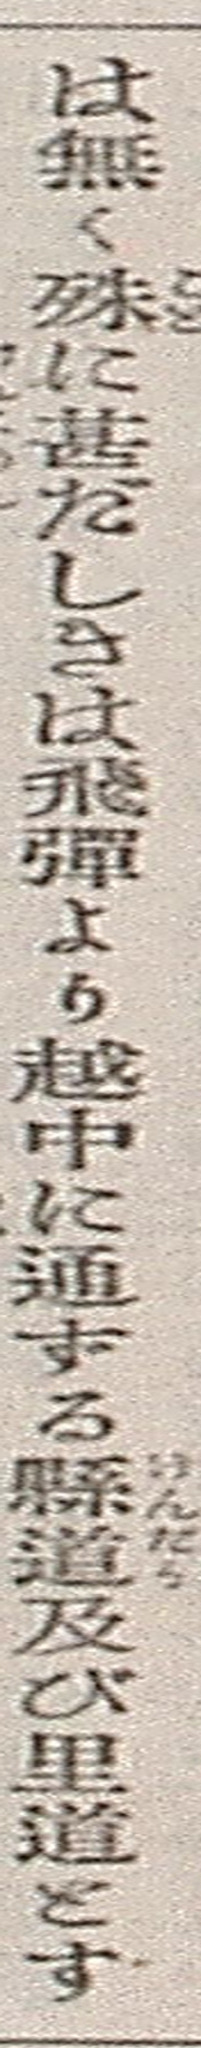は無く殊に甚だしきは飛騨より越中に通ずる県道及び里道とす
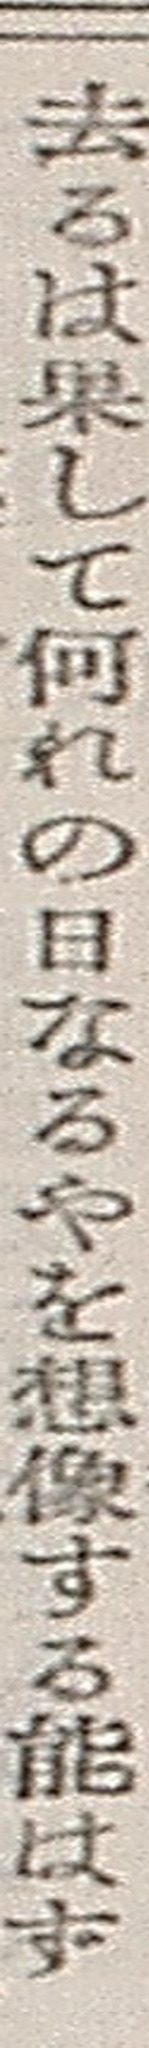去るは果して何れの日なるや想像する能はず
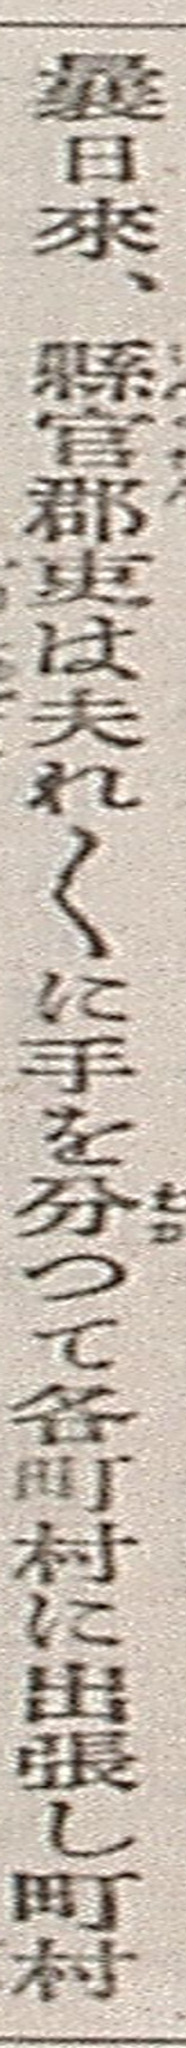曩日來、縣官郡吏は夫れ〳〵に手を分つて各町村に出張し町村
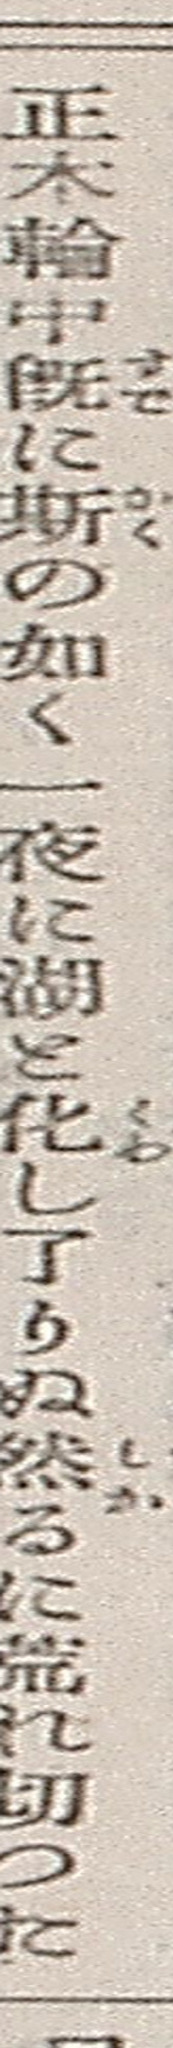正木輪中既に斯の如く一夜に湖と化し了りぬ然るに荒れ切つた
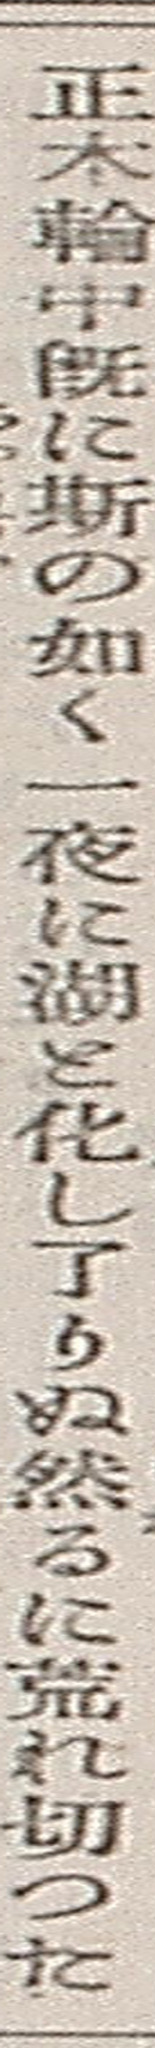正木輪中既に斯の如く一夜に湖と化し了りぬ然るに荒れ切つた
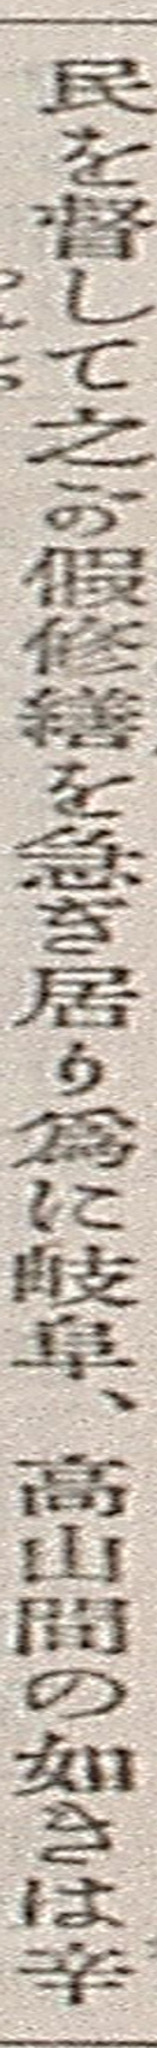民を督して之が仮修繕を急ぎ居り為に岐阜、高山間の如きは辛
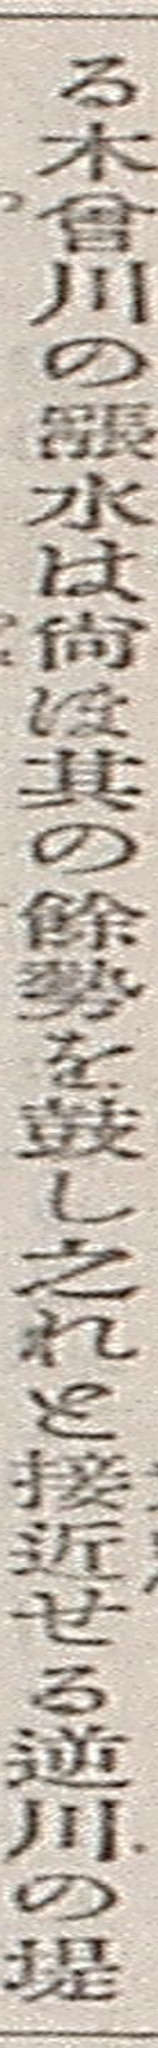る木曽川の張水は尚ほ其の餘勢を鼓し之れと接近せる逆川の堤
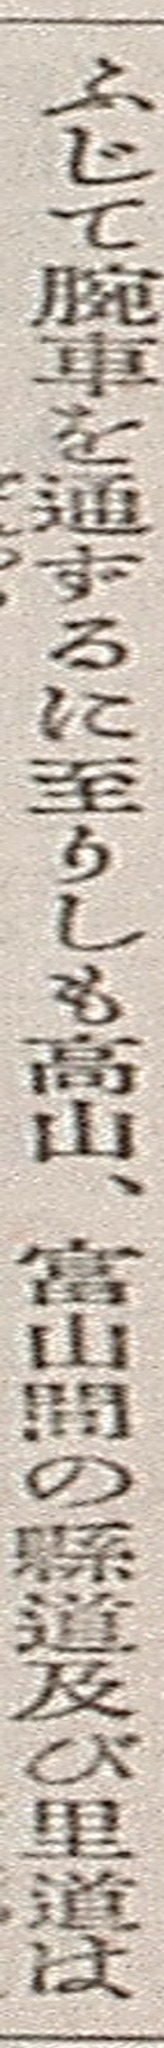ふじて腕車を通ずるに至りしも高山、富山間の県道及び里道は
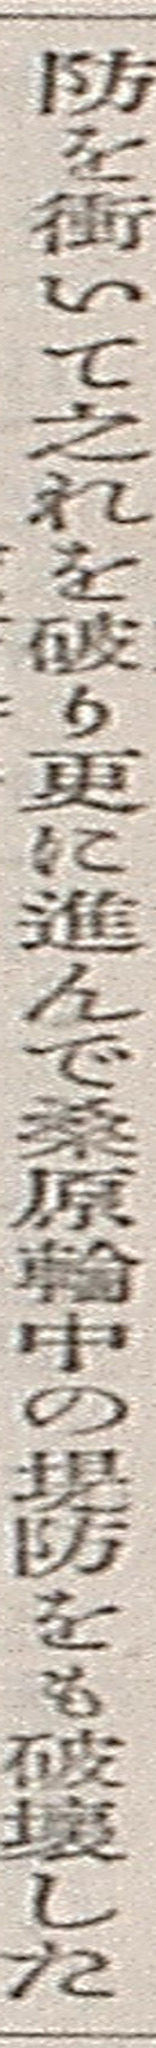防を衝いて之れを破り更に進んで桑原輪中の堤防をも破壊した
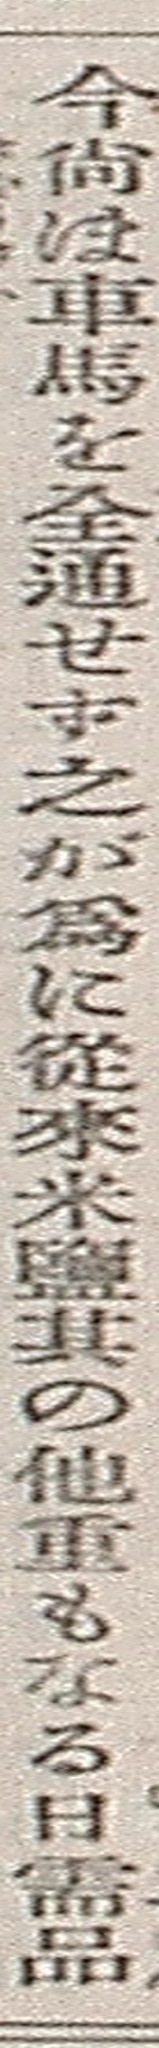今尚ほ車馬を全通せず之が為に従来米鹽其の他重なる日需品
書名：風俗畫報臨時増刊第百二十六號　洪水被害録（中）
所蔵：東京大学地震研究所図書室 Earthquake Research Institute Library, The University of Tokyo, JAPAN
